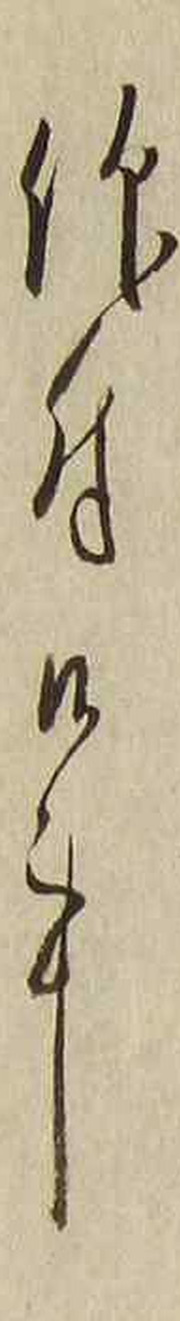仰付候事

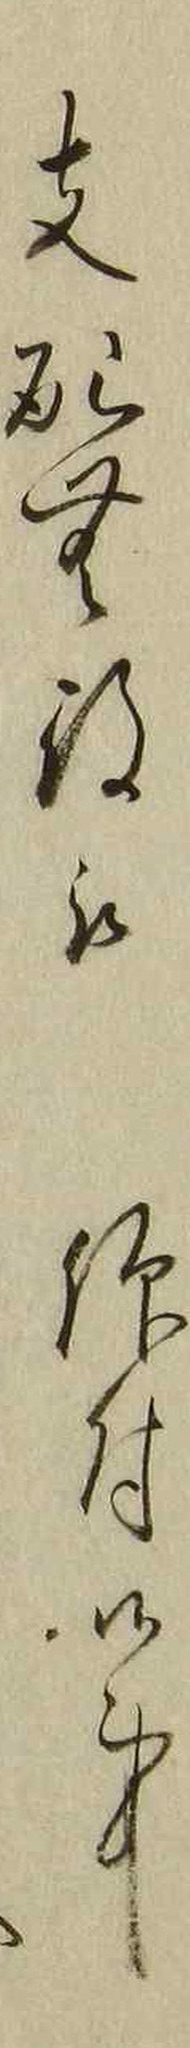支配無役被仰付候事
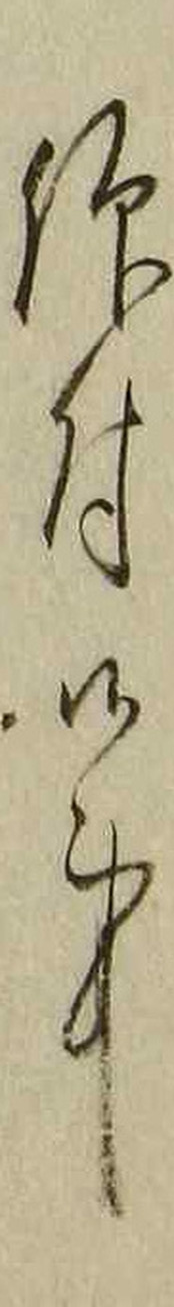仰付候事
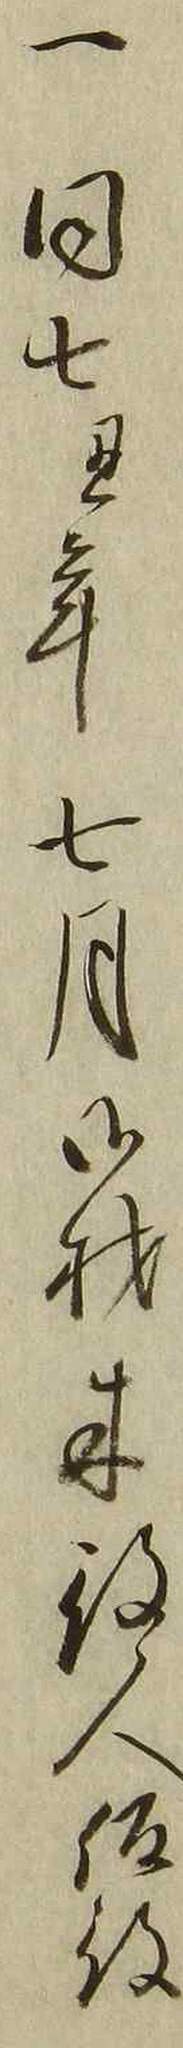一同七丑年七月御材木役人仮役
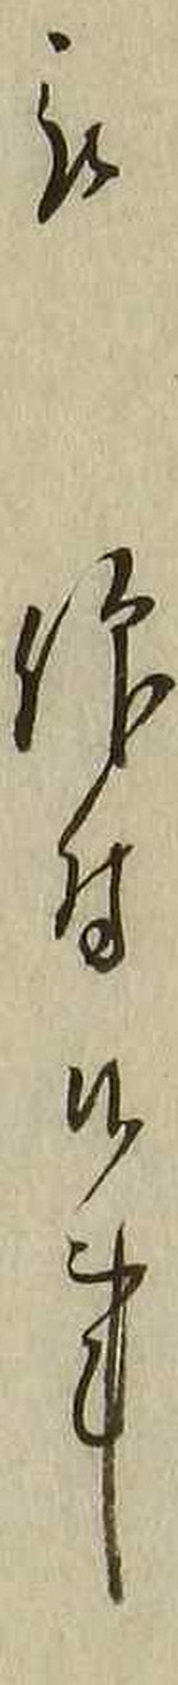被仰付候事
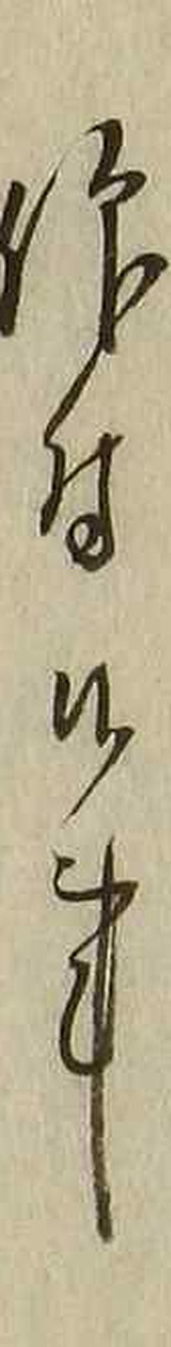仰付候事
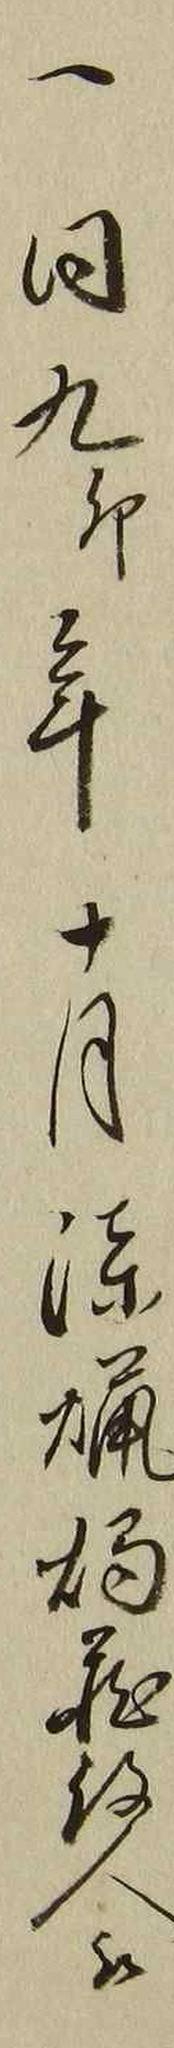一同九卯年十月漆蝋燭蔵役人被
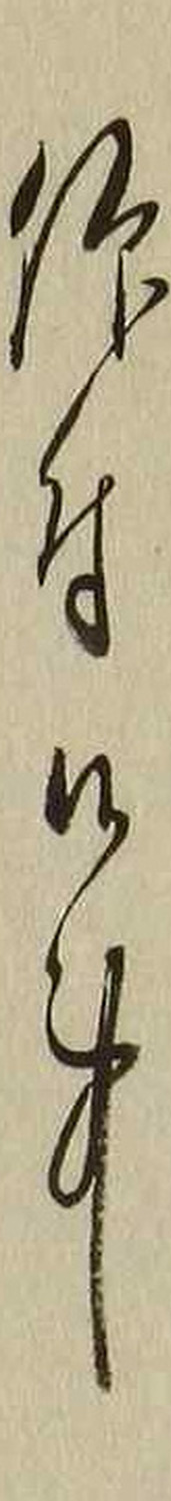仰付候事
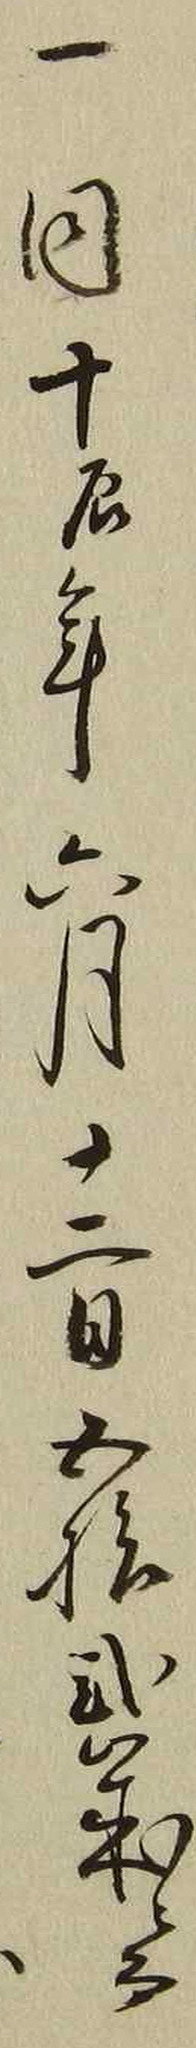一同十辰年六月十二日五拾弐歳ニ而
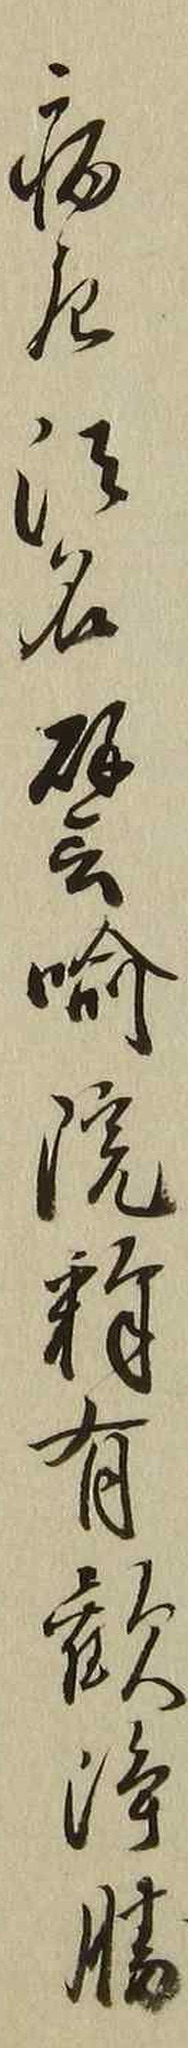病死法名譬喩院釈有歓浄勝
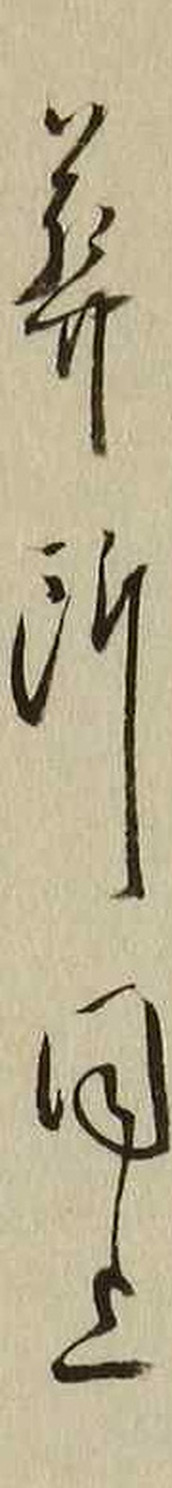葬所同上
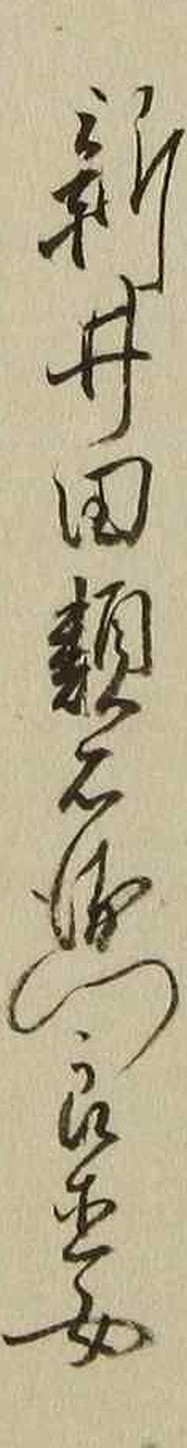女新井田類右衛門良直女
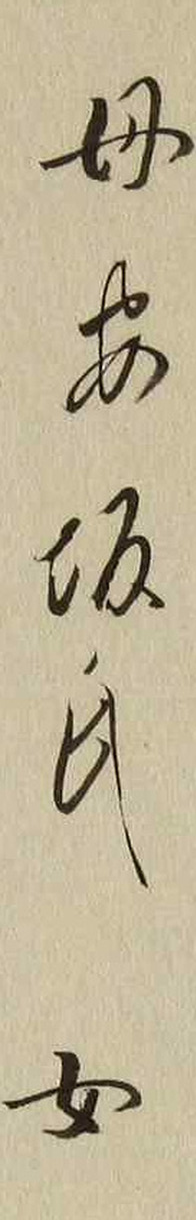母安坂氏女
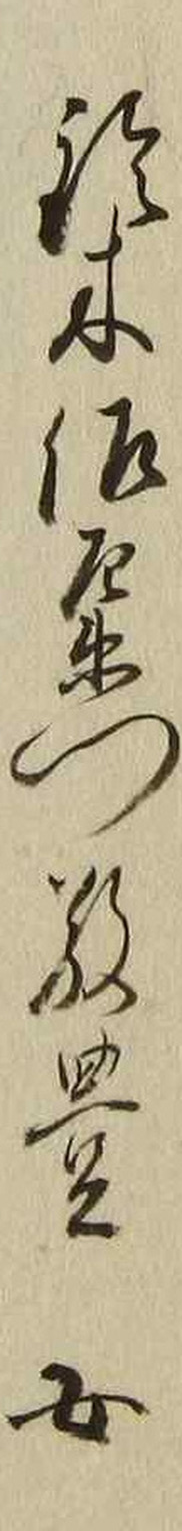女鈴木佐左衛門敬豊女
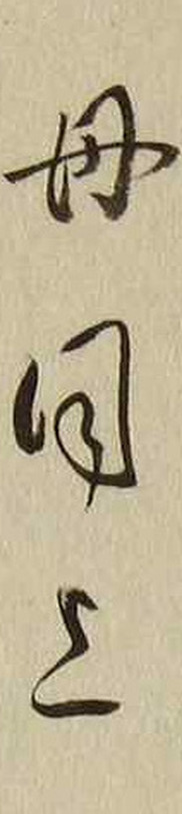母同上
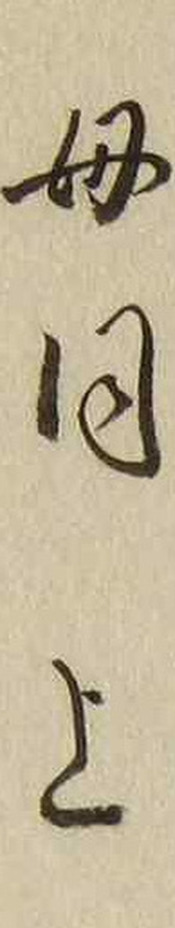母同上
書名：諸士系譜　巻之132　た之部8
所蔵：会津若松市立会津図書館
